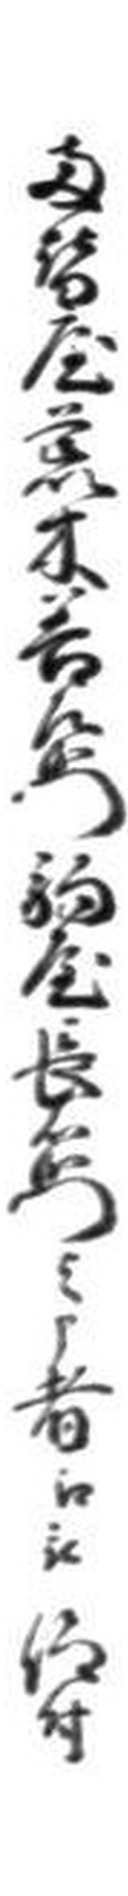両替屋荒木善左衛門駒屋長右衛門と申者江被仰付
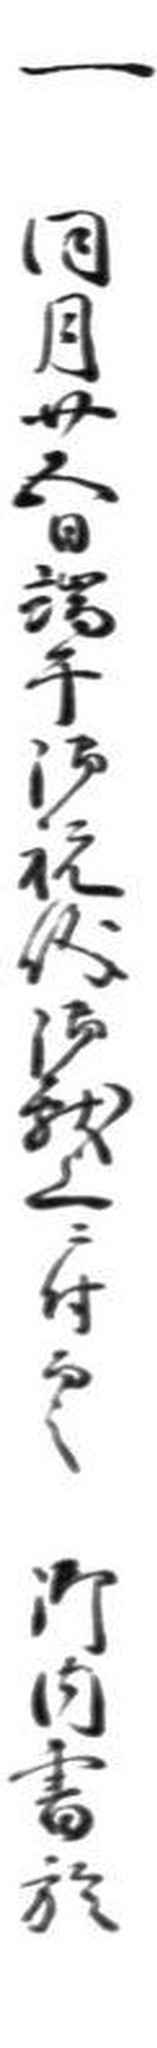一同月廿五日端午御祝儀御献上ニ付而之御内書於
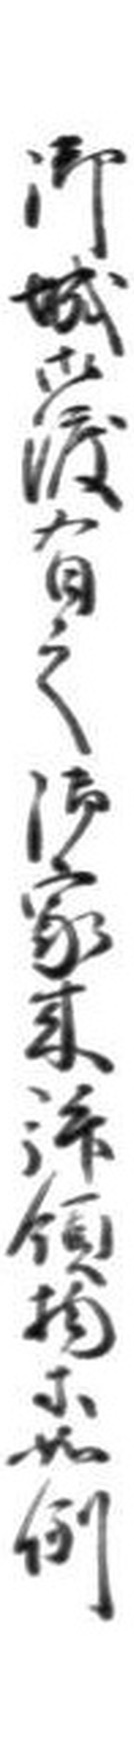御城御渡有之御家来拝領物等如例
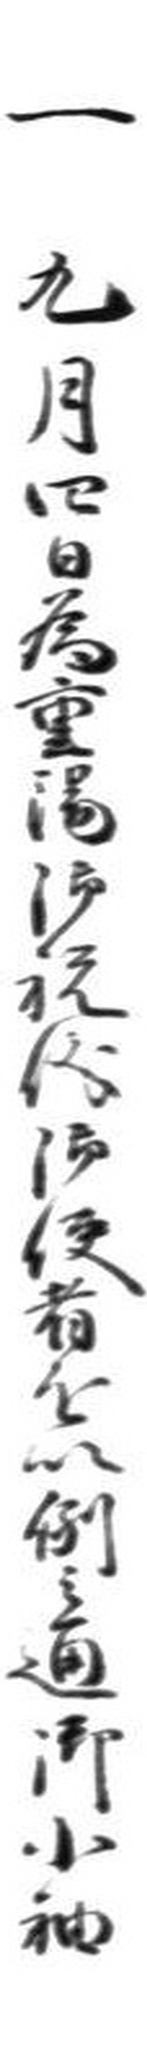一九月四日為重陽御祝儀御使者を以例之通御小袖
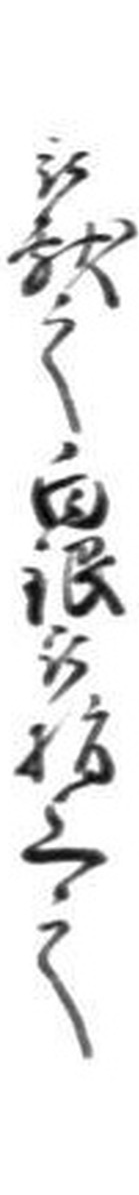被献之白銀被指上之
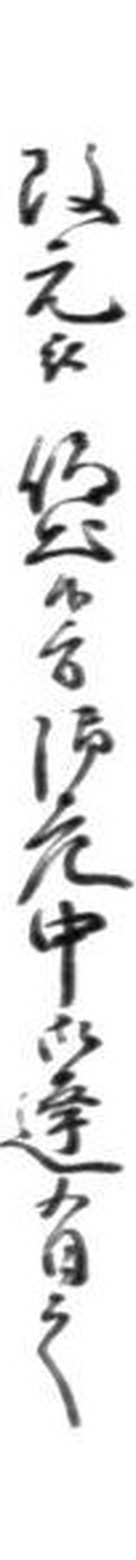改元被仰出候旨御老中御達有之
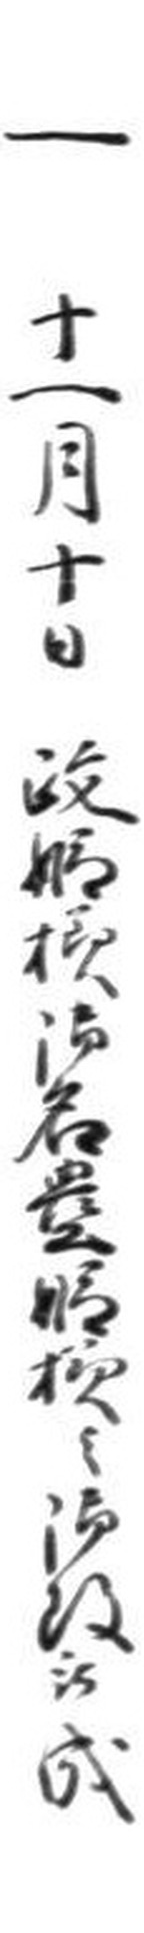一十一月十日政姫様御名豊姫様と御改被成

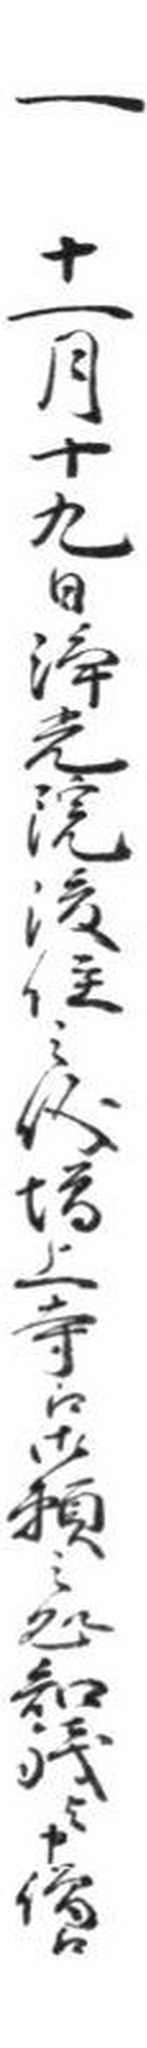一十一月十九日浄光院後住之儀増上寺江御頼之処知残と申僧江
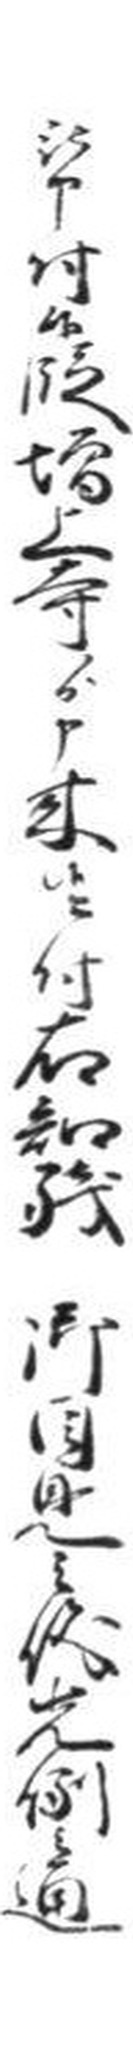被申付候段増上寺ゟ申来候ニ付右知残御目見之儀先例之通
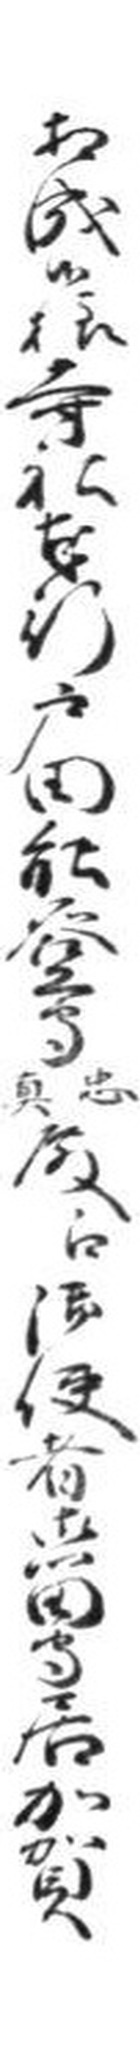相成候様寺社奉行戸田能登守忠真殿江御使者御留守居加賀
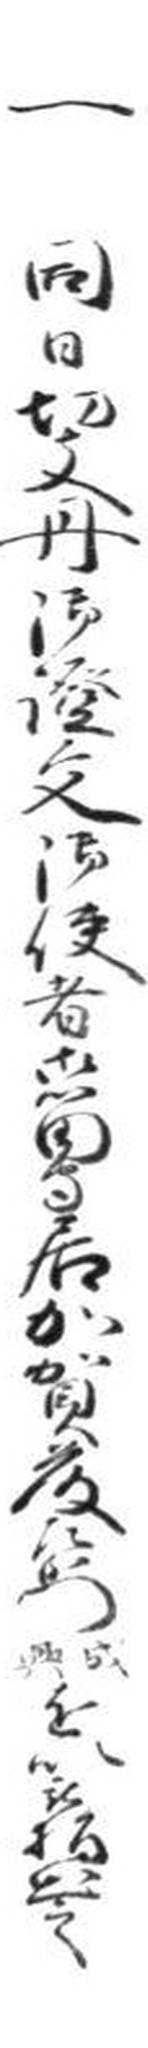一同日切支丹御証文御使者御留守居加賀藤左衛門成興を以被指出之
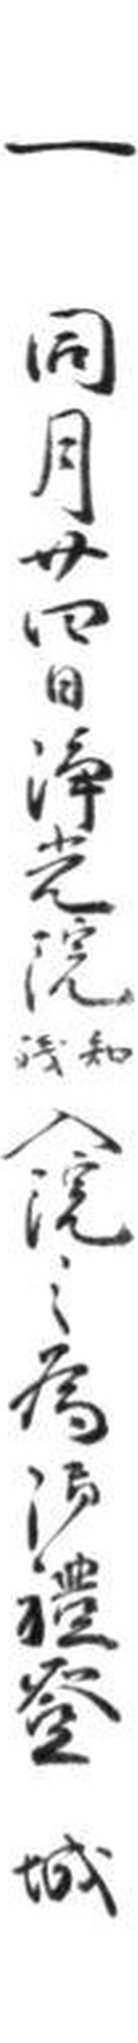一同月廿四日浄光院知残入院之為御礼登城
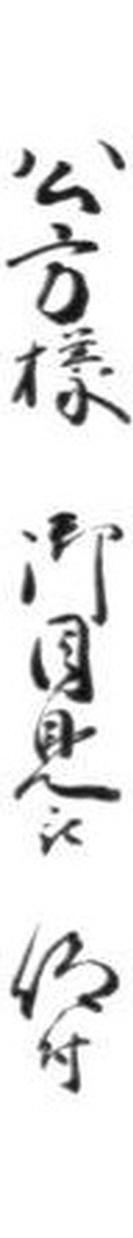公方様御目見被仰付
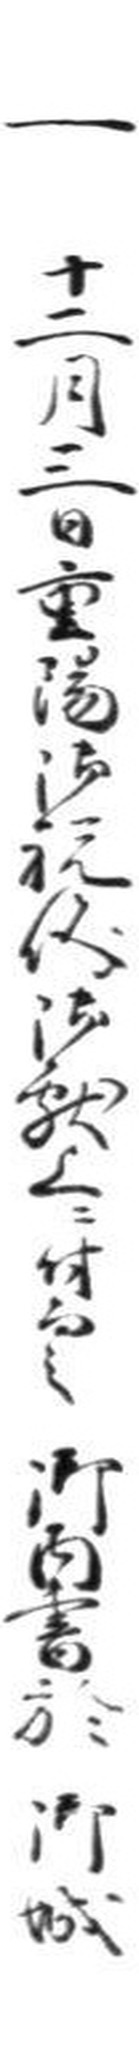一十二月三日重陽御祝儀御献上ニ付而之御内書於御城
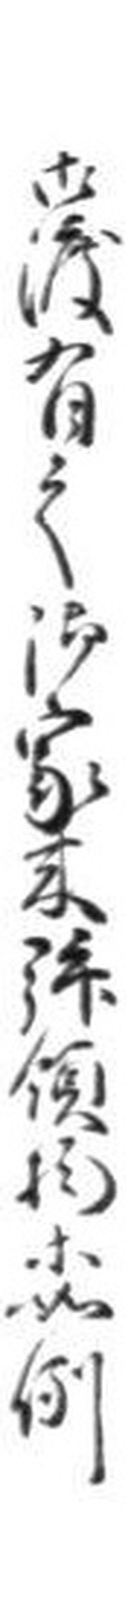御渡有之御家来拝領物等如例
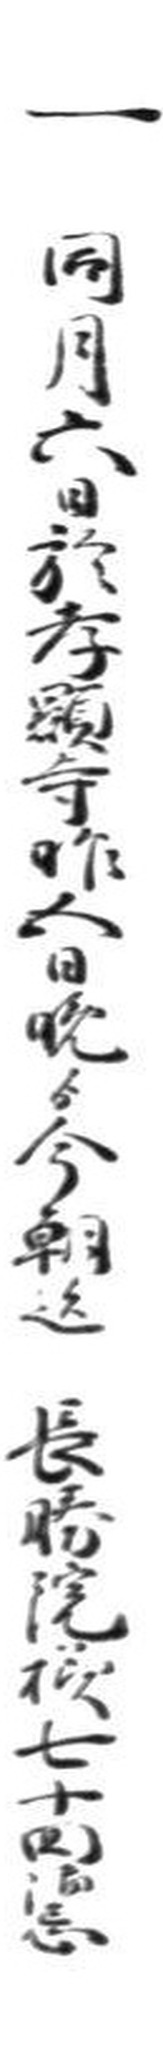一同月六日於孝顕寺昨五日晩ゟ今朝迄長勝院様七十回御忌
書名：家譜 十七 吉品公 従元禄元年到同二年
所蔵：福井県文書館 Fukui Prefectural Archives
